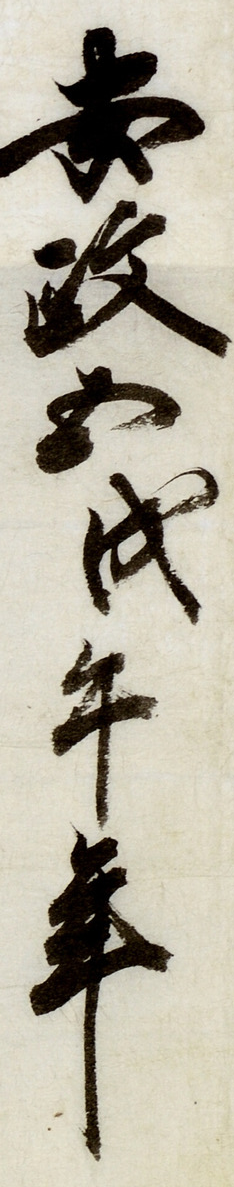安政五戊午年
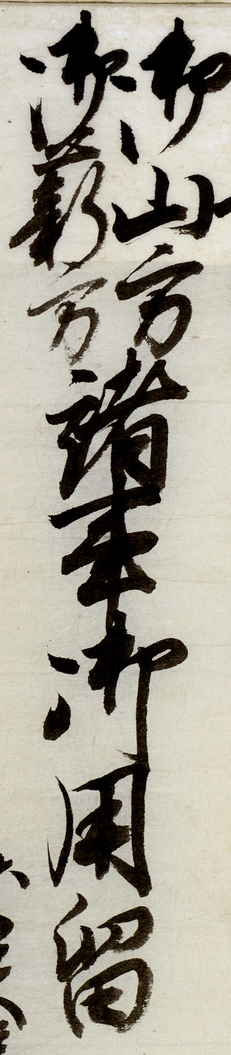御薪方諸事御用留
